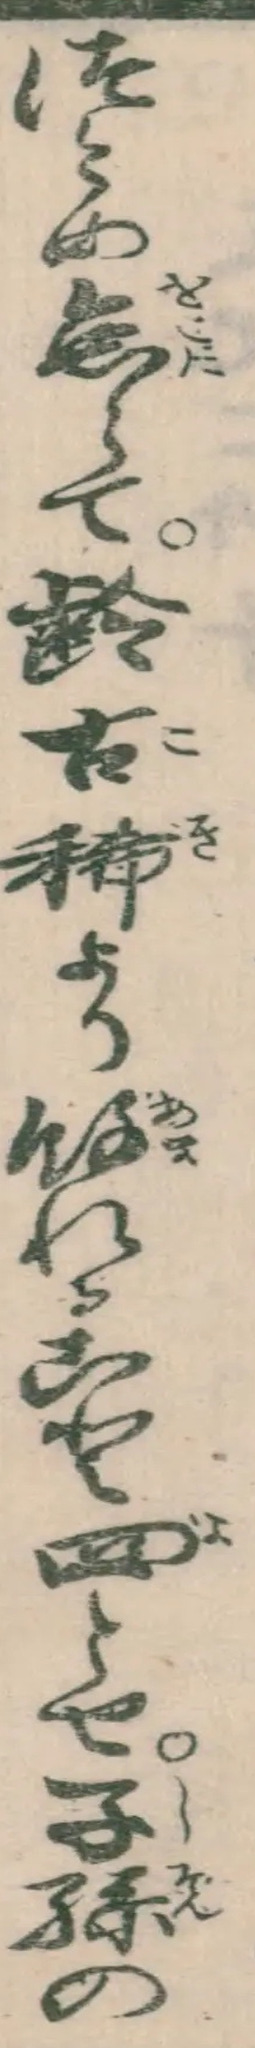つとめ怠らて。齢古希より余れること四とせ。子孫の
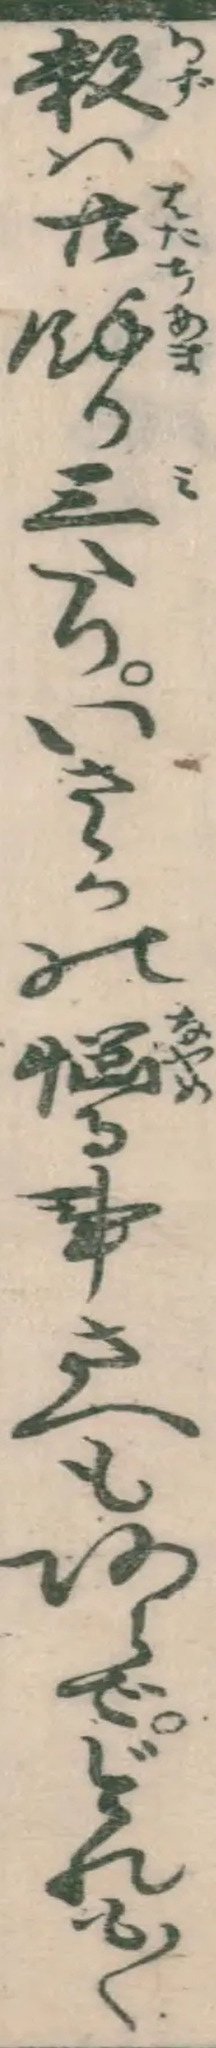数多は廿余り三たつ。いさゝかの悩る事さへあらで。どのも〳〵
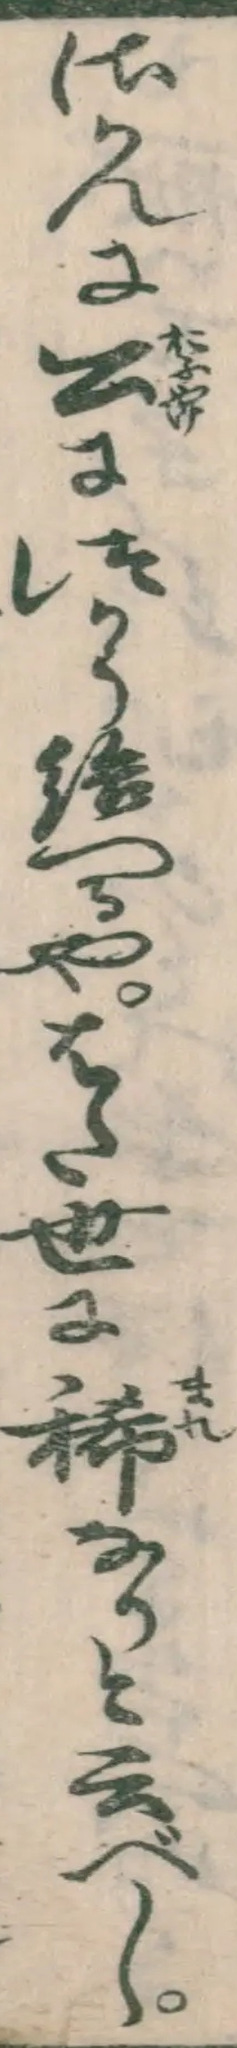さかんに公につかう結つるや。はた世に稀なりと伝べし。
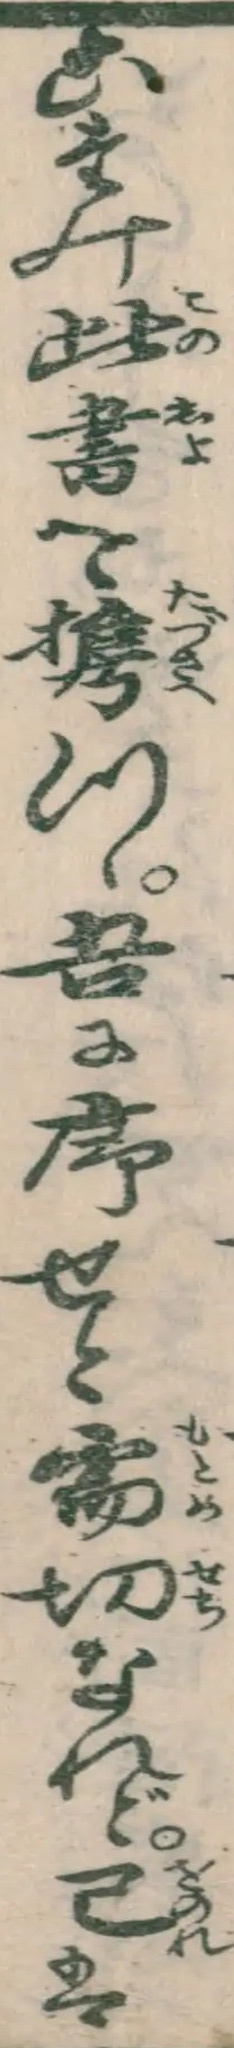こたの此書を携いく。吾に序せと需切なれど。己は
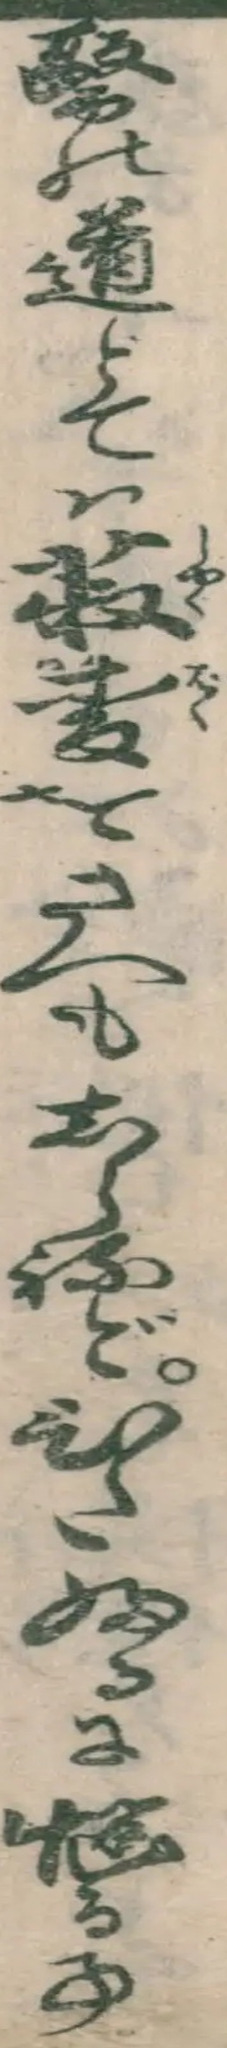醫の道とては菽麦をさへもしらねど。ひたふるに悩る事

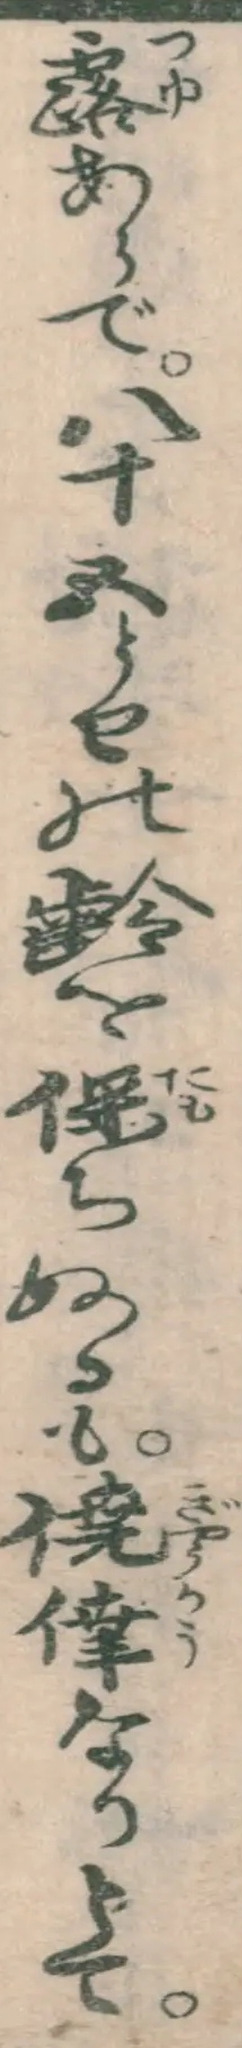露あれで。八十五とり巳の齢を保ちふるも。僥倖なりとて。
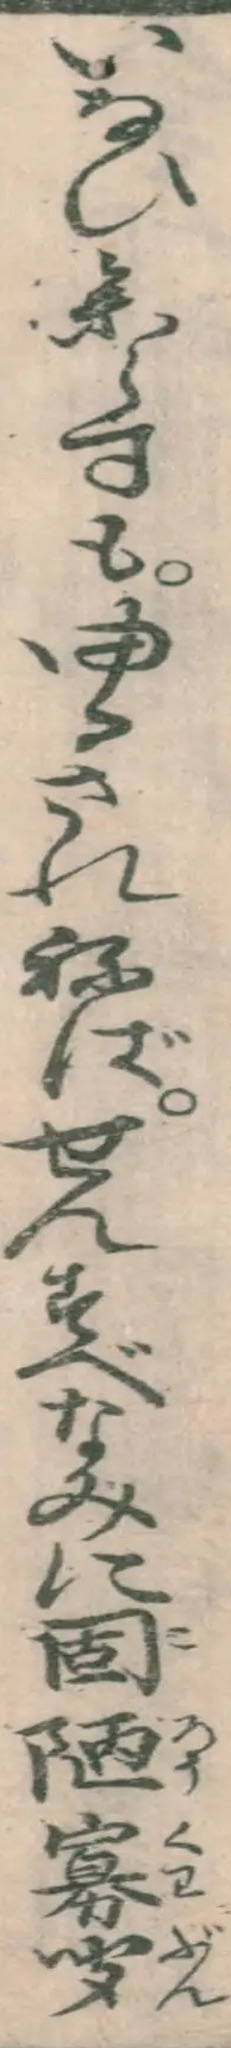いなひ参らすも。ゆるされねば。せんすべなみに固陋寡聞
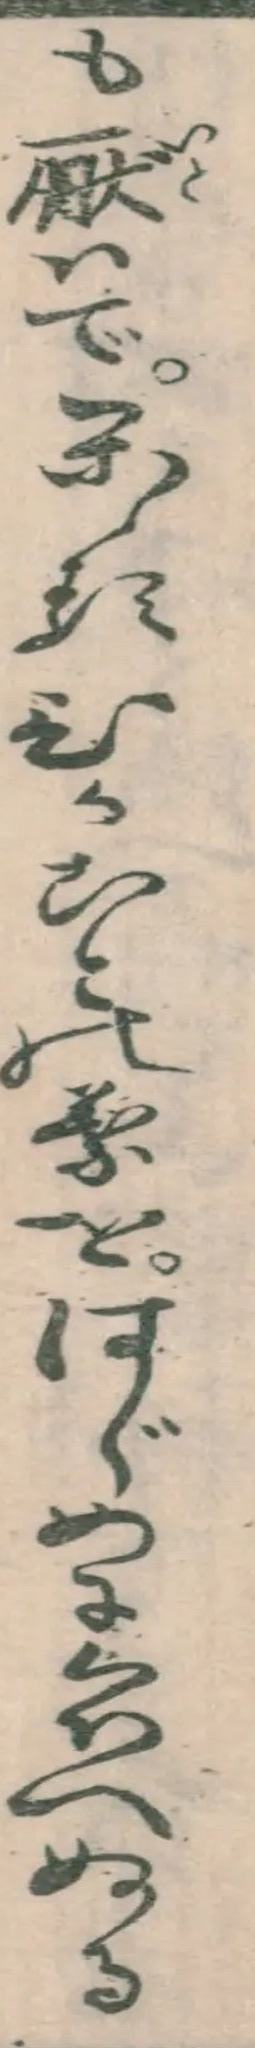も厭いで。かゝるひかことの葉を。はじめにくはへぬる
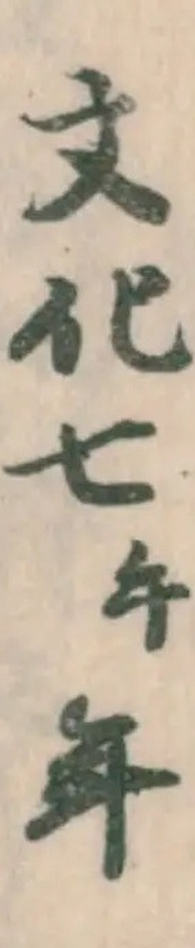文化七午年
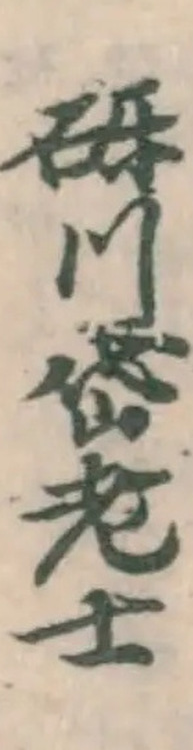硃川岱老士
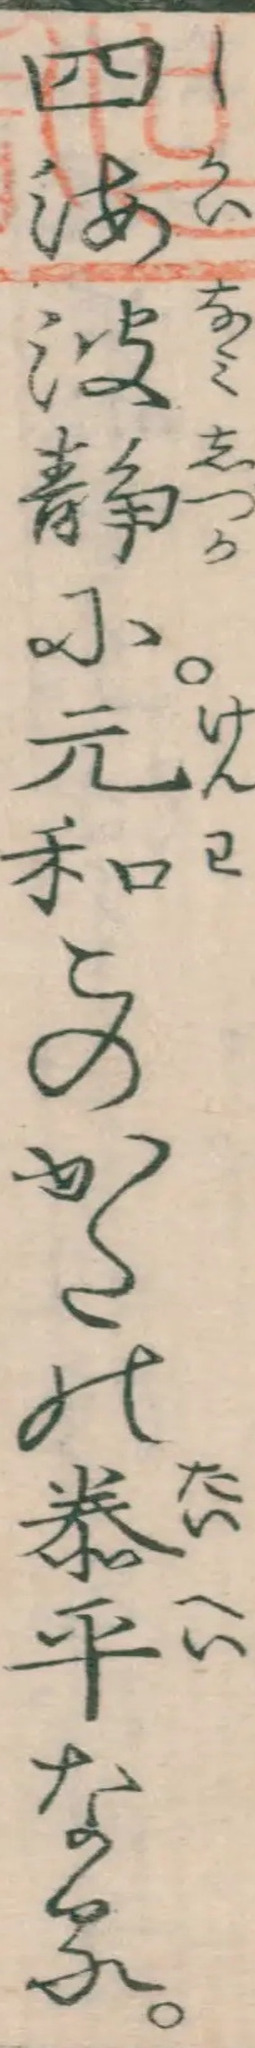四海波静に。元和このかたの泰平なる
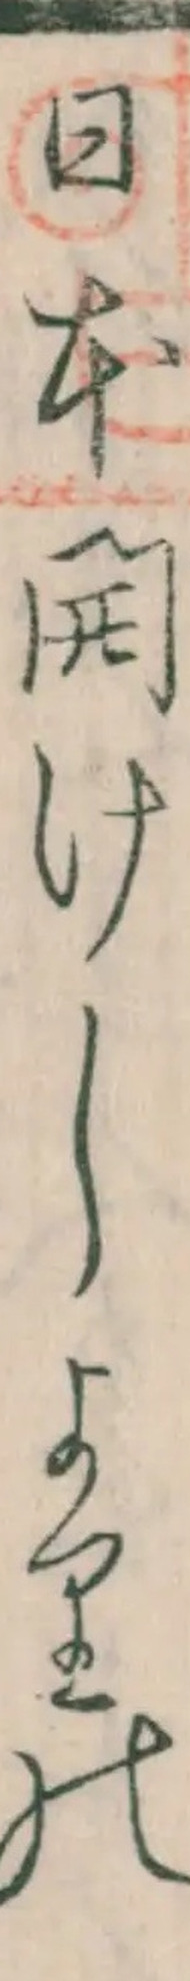日本開けしよりの
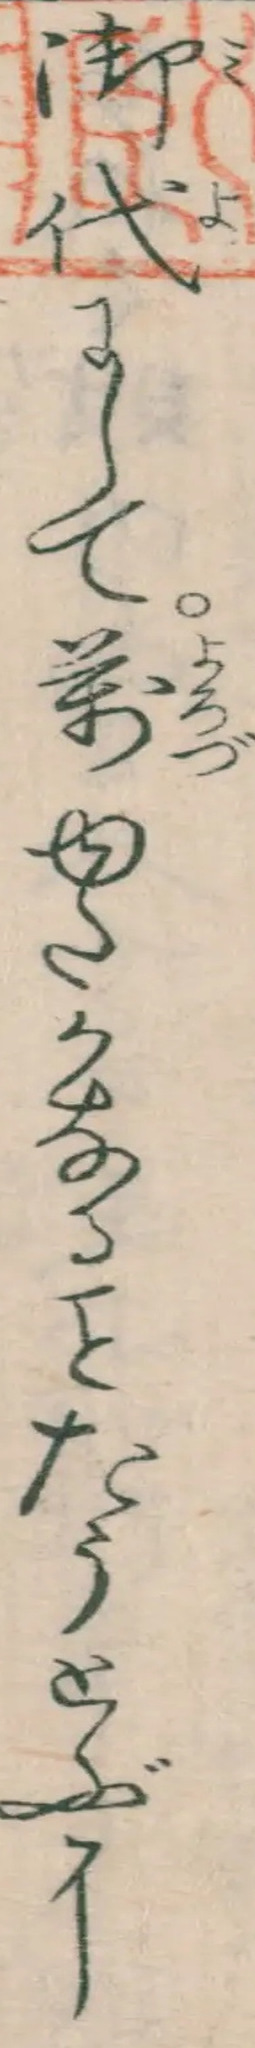御代にして。萬異ゆたかなることたうとぶに
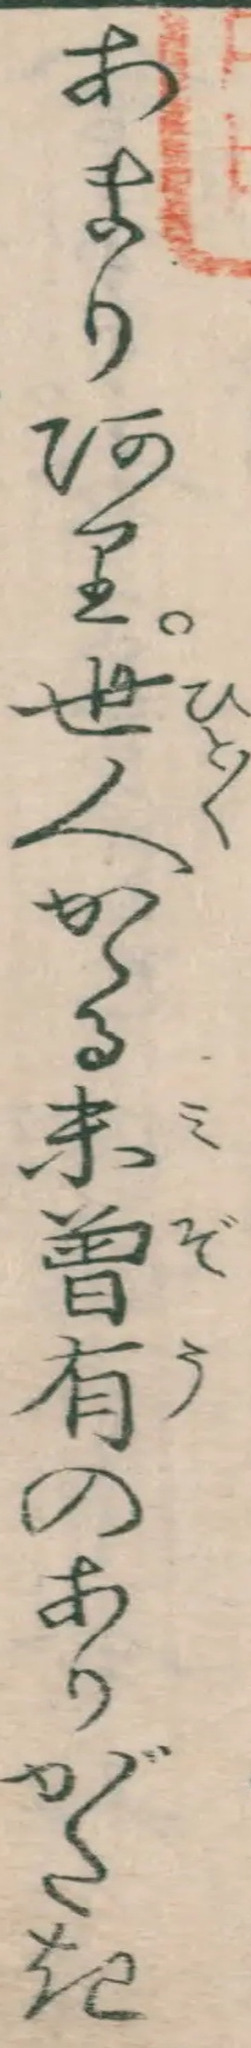あまりあり。世人かゝる未曾有のありがたき
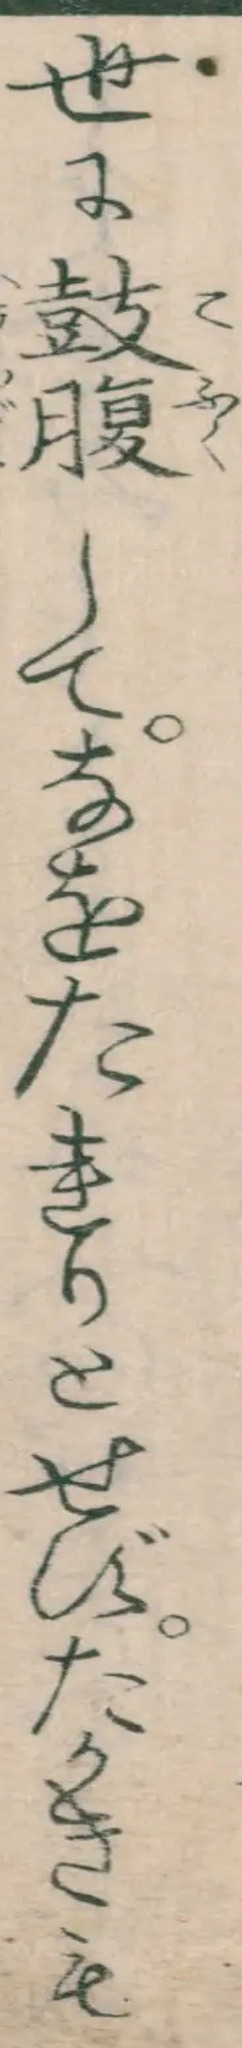世に鼓腹して。なをたれりとせず。たかきも
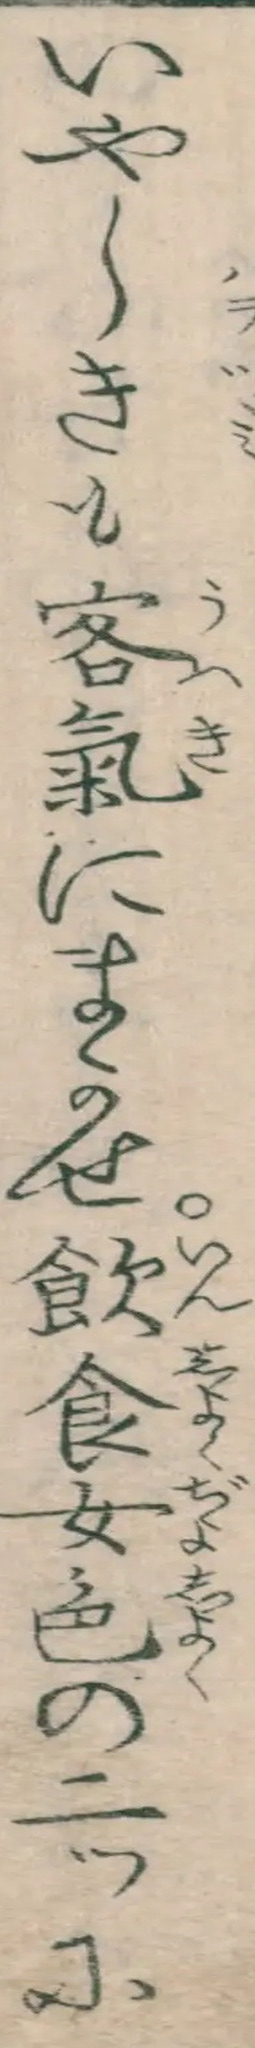いやしきも客氣にまかせ。飲食女色の二つに
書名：瘡家示訓
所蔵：国立国会図書館 National Diet Library, JAPAN
